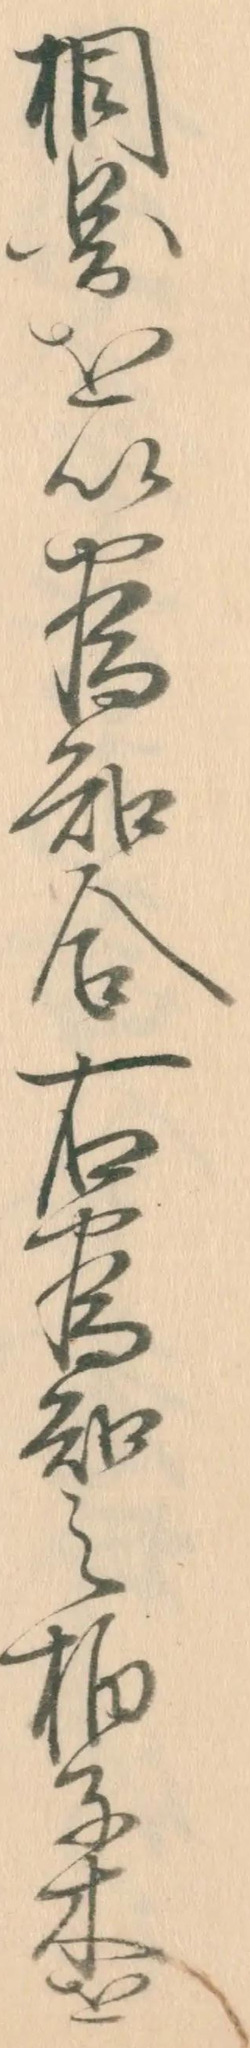相図を以為知合右為知之拍子木を
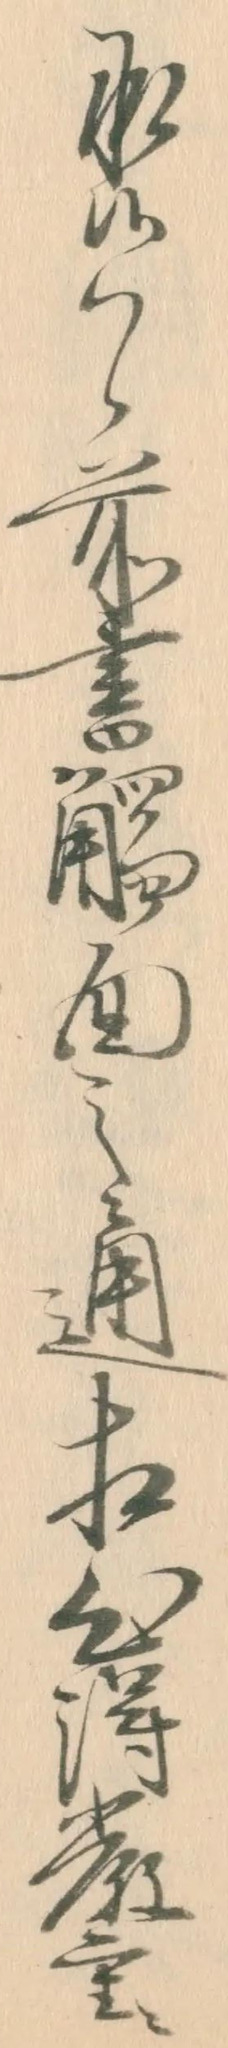承候ハヽ前書触面之通相心得厳重ニ
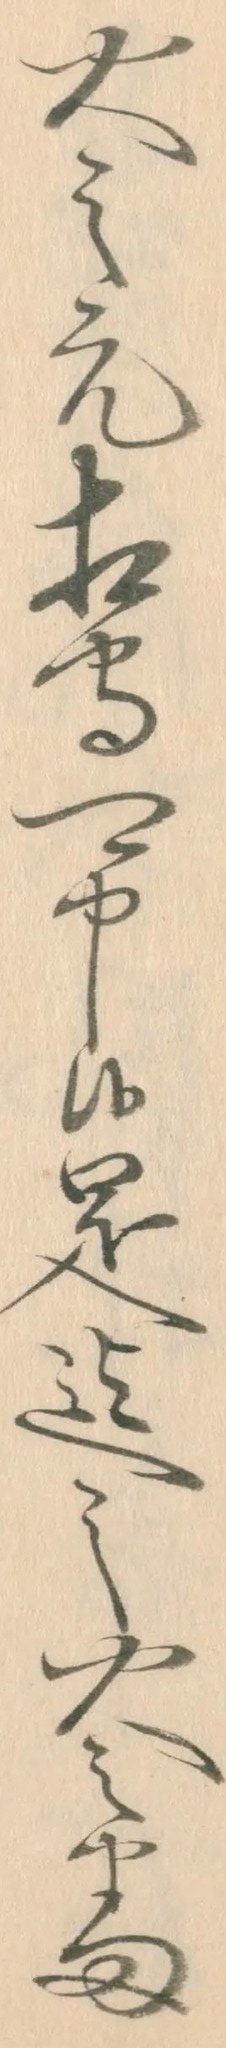火之元相守可申候是迄之火之番
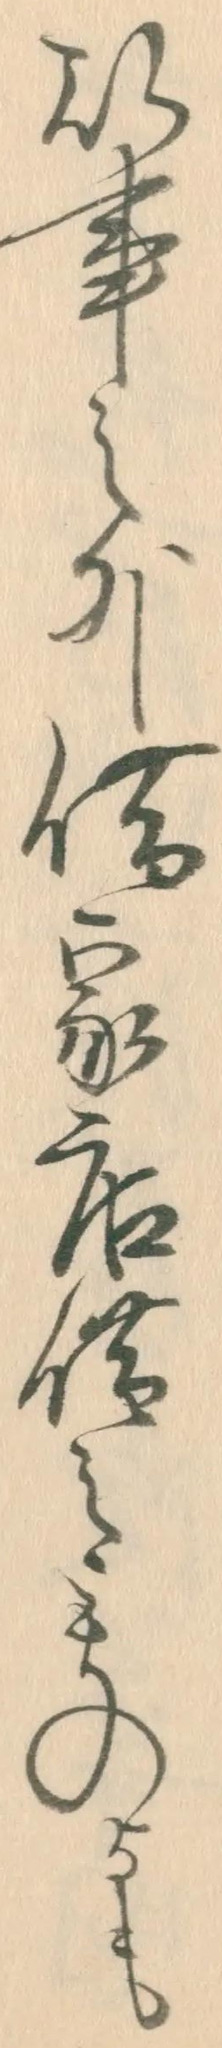行事之外借家店借之ものとも
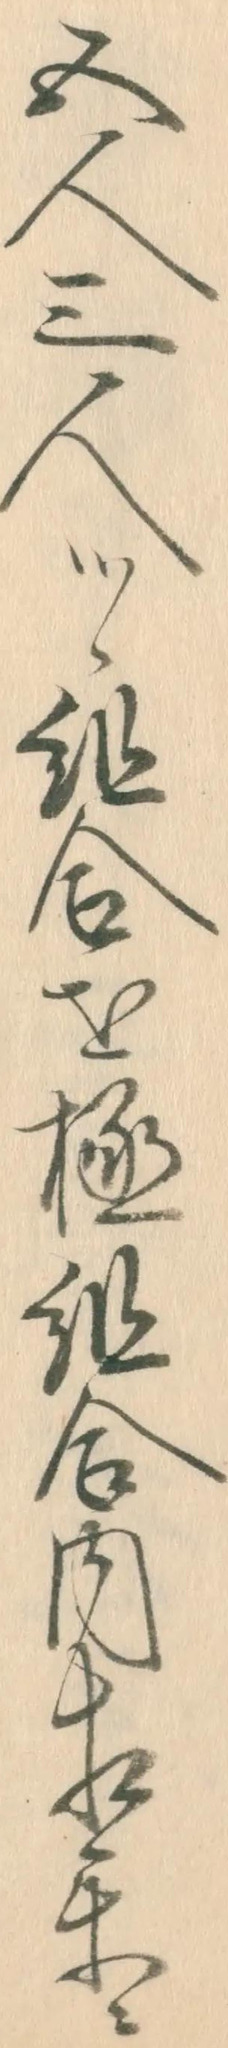五人三人ツヽ組合を極組合内相互ニ
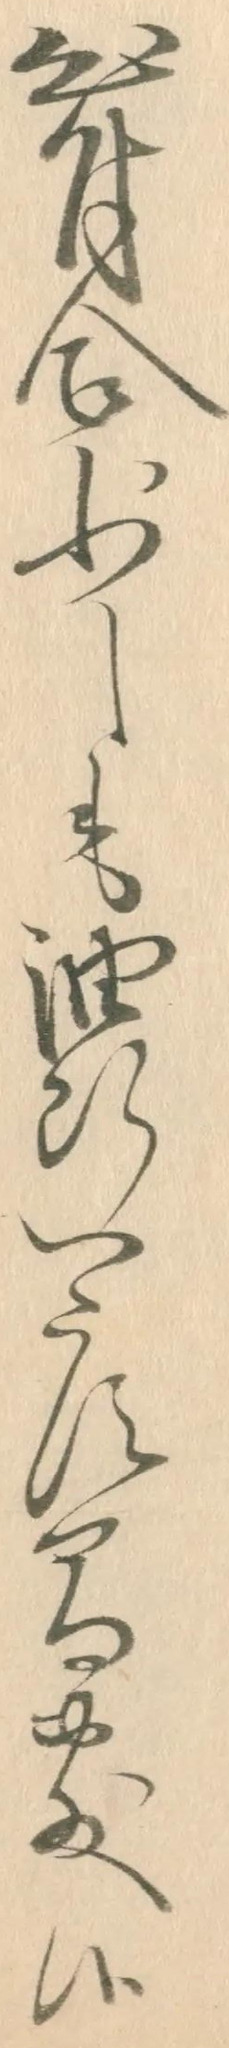心付相少しも油断いたす間敷候

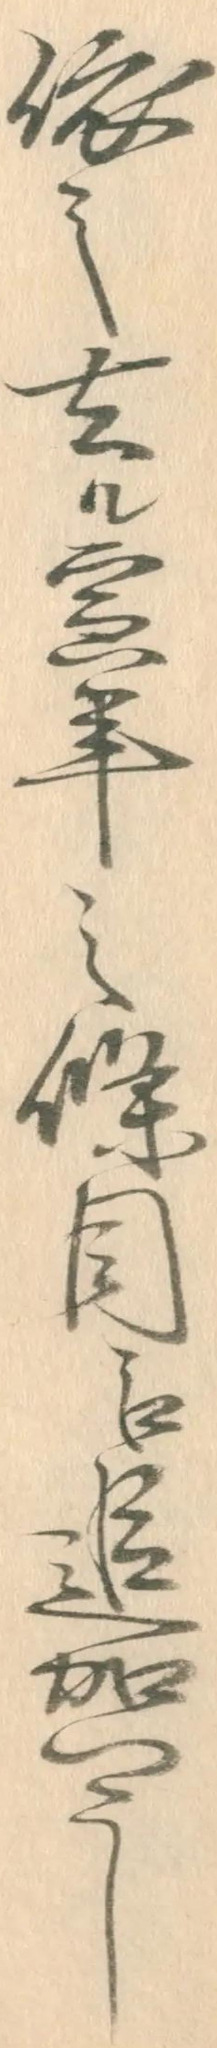依之去ル寅年之条目え追加いたし
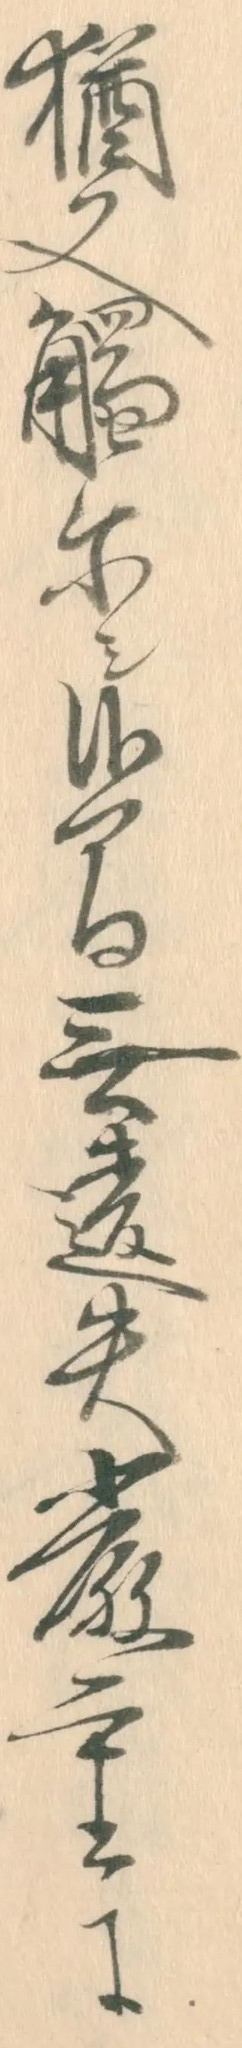猶又触示シ候間無違失厳重に
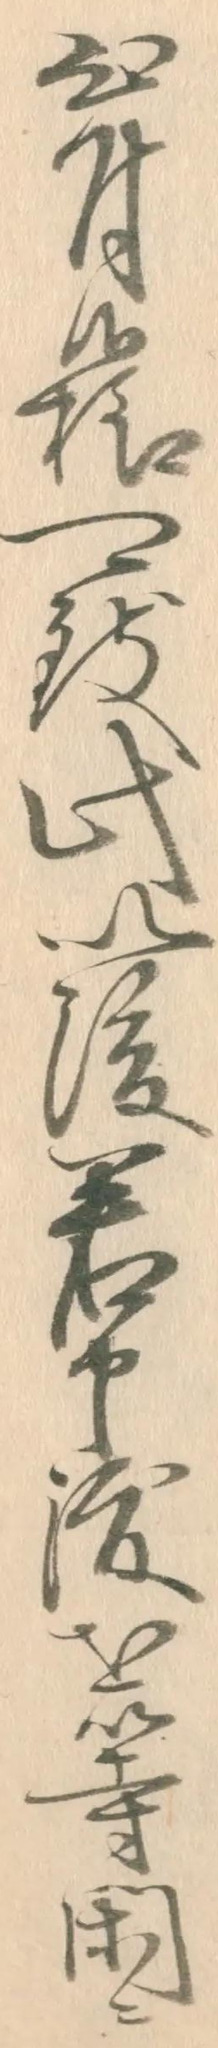心付候様可致此以後若申渡を等閑ニ
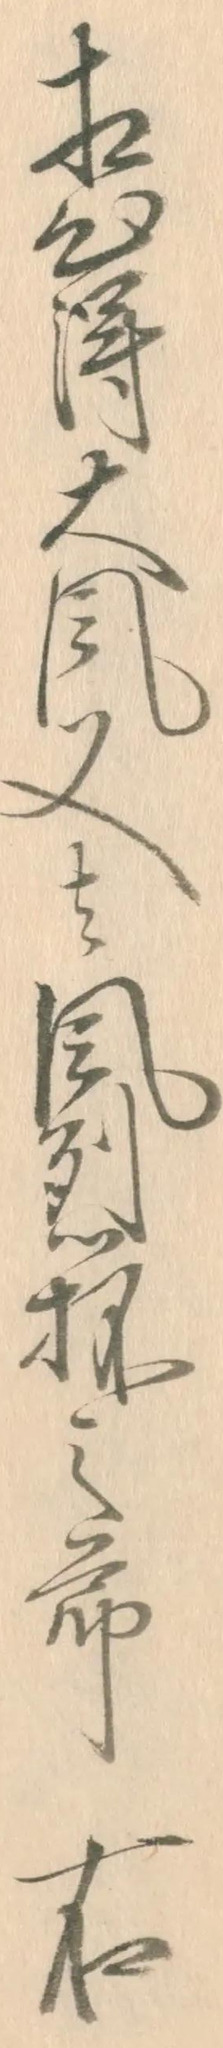相心得大風又は風烈抔之節右
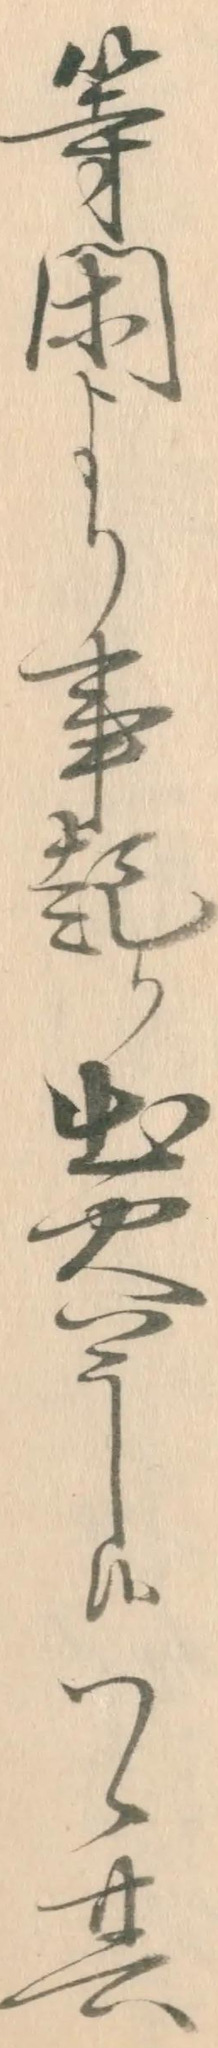等閑より事起り出火いたし候ハヽ其
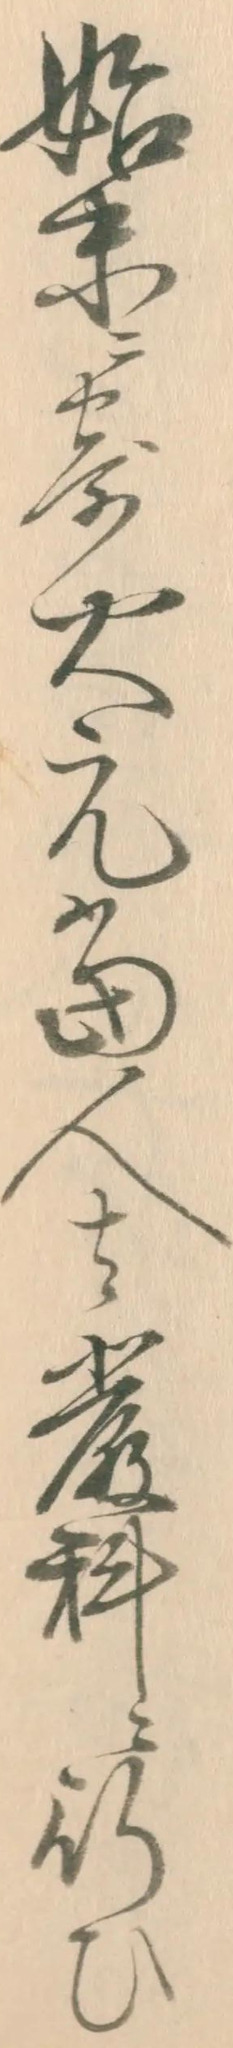始末ニ寄火元当人は厳科ニ行ひ
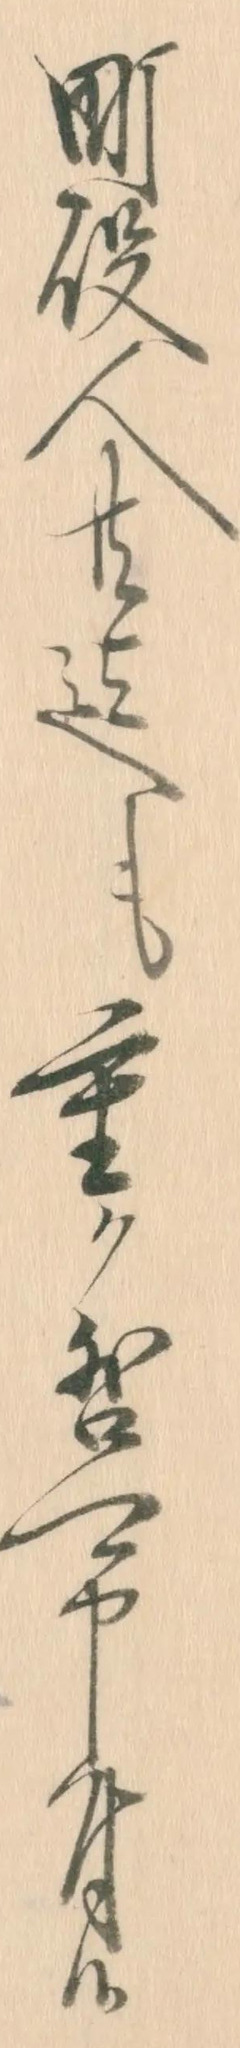町役人共迄も重ク咎可申付候
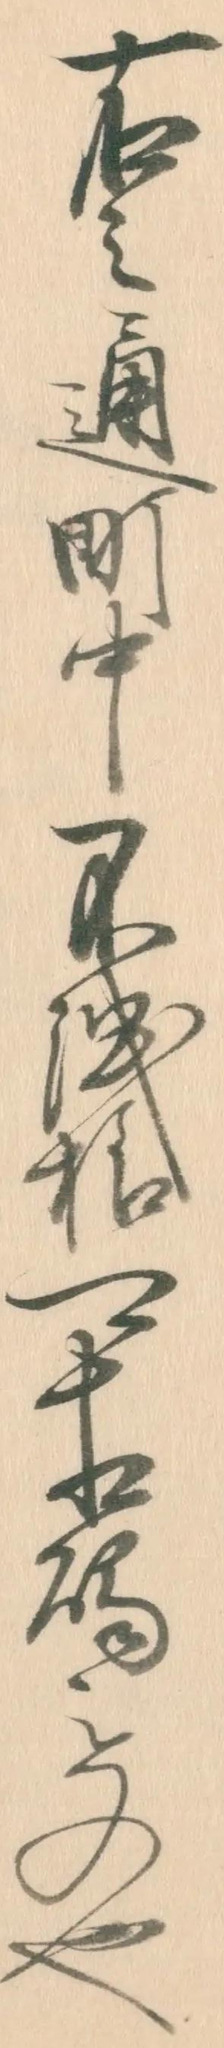右之通町中不漏様可相触もの也
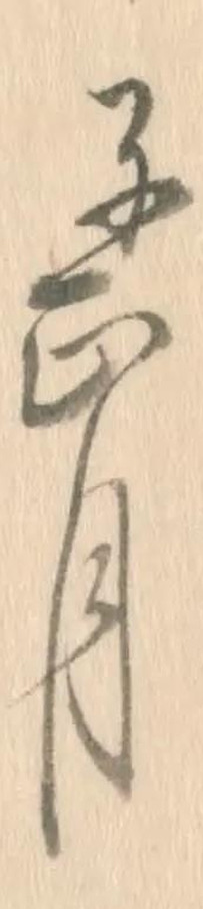子正月

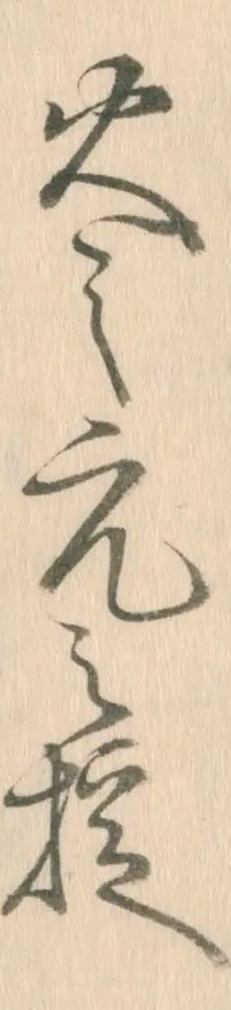火之元之掟
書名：三橋 17巻. [7] 三橋小破御修復書留　但御奉行御掛リ替地震潰橋番屋　嘉永四亥年より安政二卯年迄　上
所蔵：国立国会図書館 National Diet Library, JAPAN
